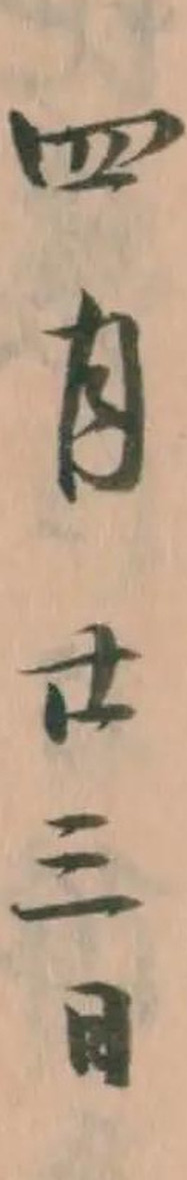四月廿三日
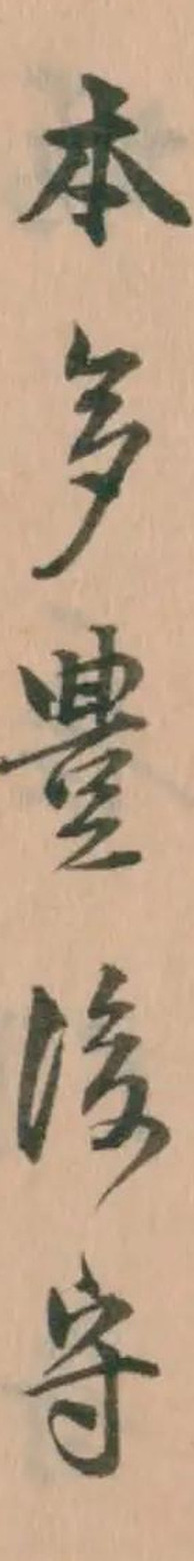本多豊後守
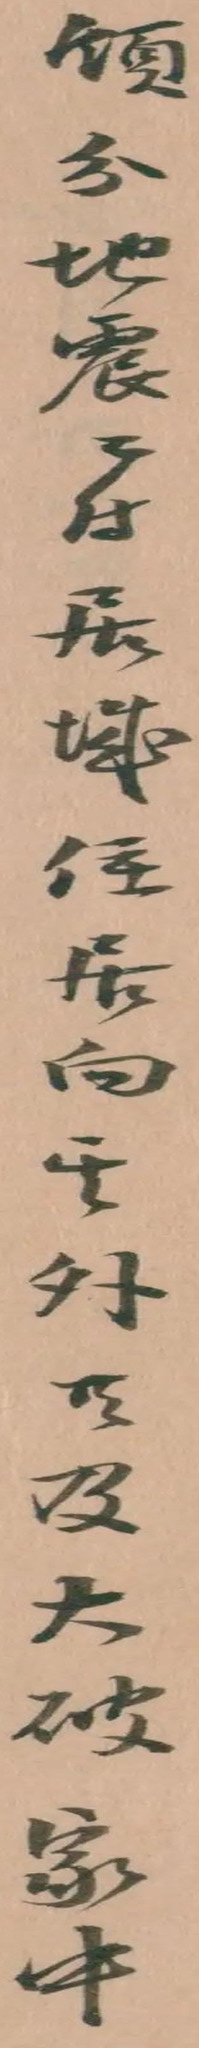領分地震ニ付居城住居向其外共及大破家中
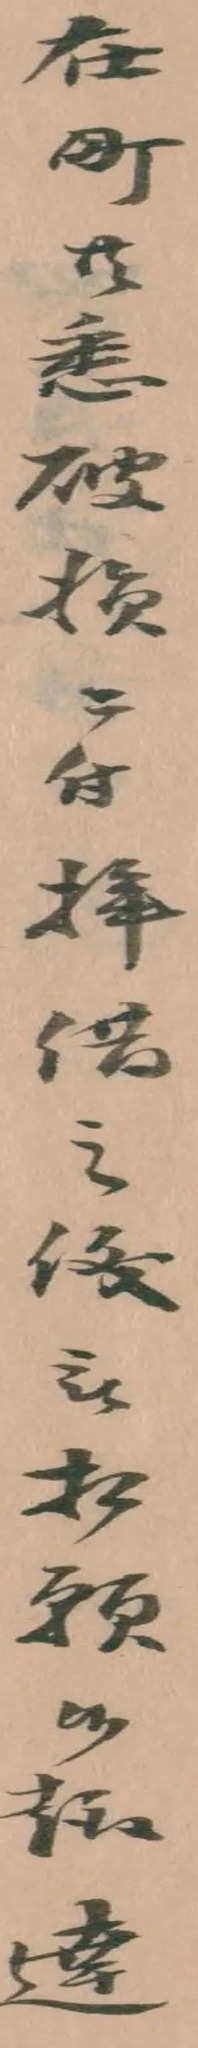在町共悉破損ニ付拝借之儀被相願候趣達
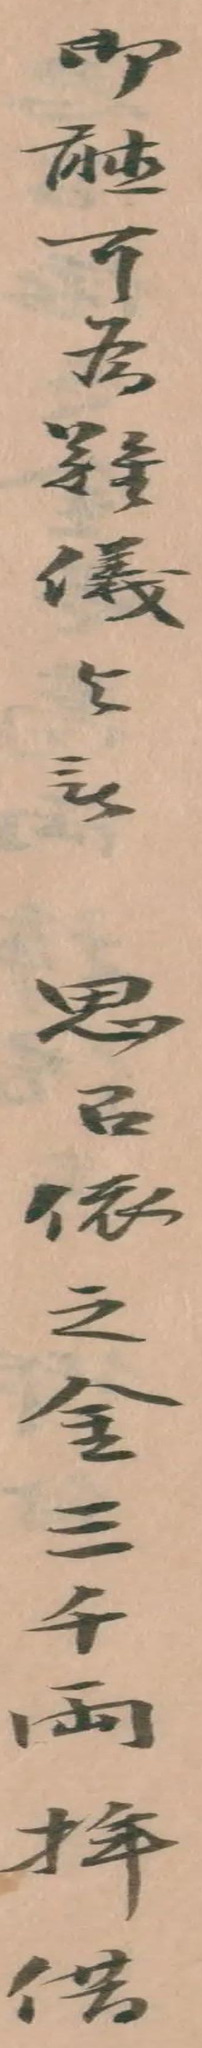御聴可為難儀と被思召候依之金三千両拝借
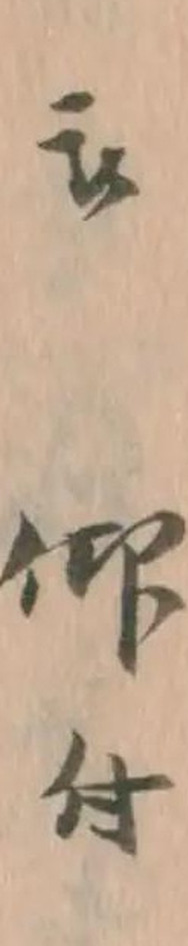被仰付
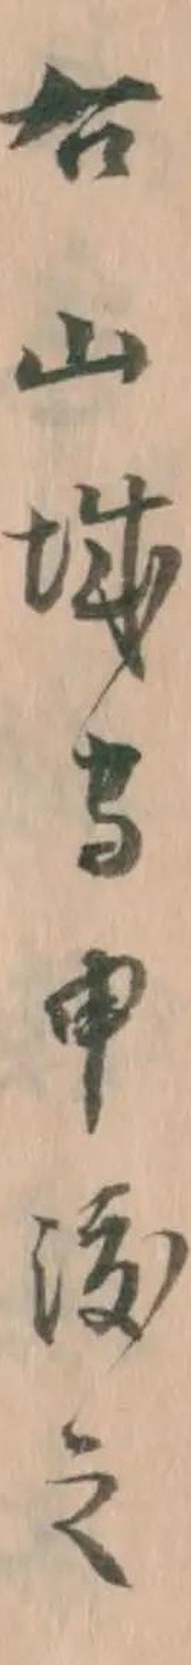右山城守申渡之

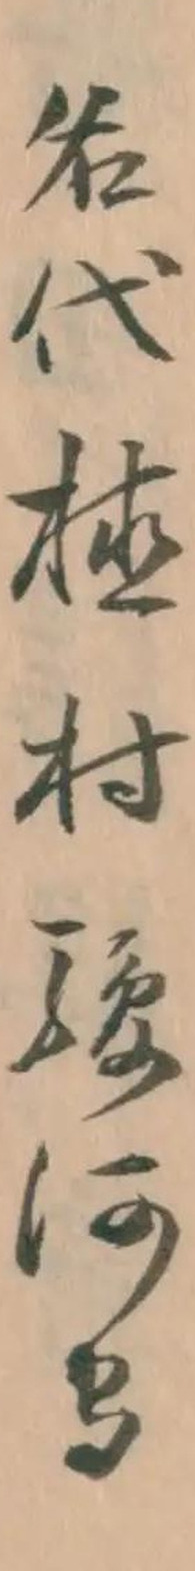名代植村駿河守
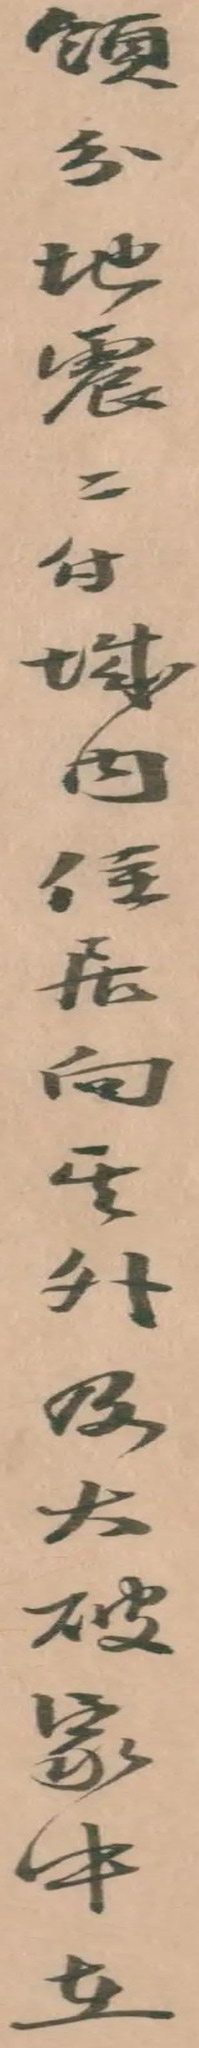領分地震二付城内住居向其外及大破家中在
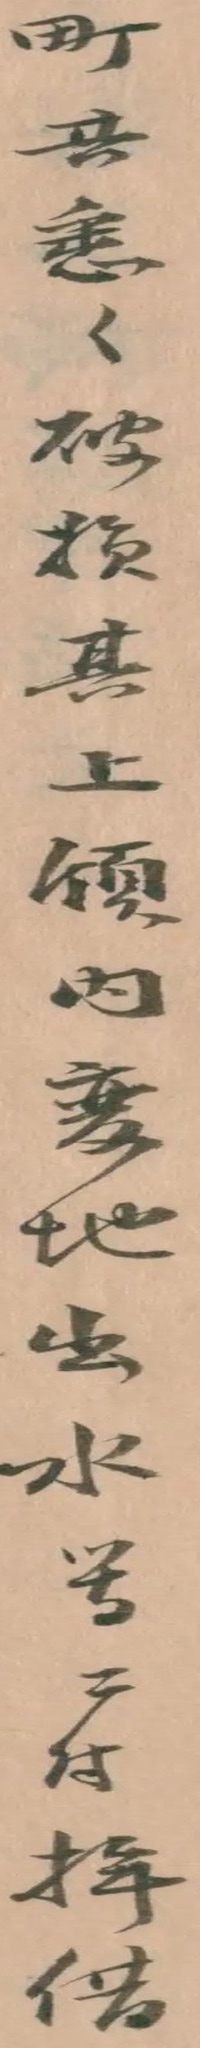町共悉く破損其上領内変地出水等二付拝借
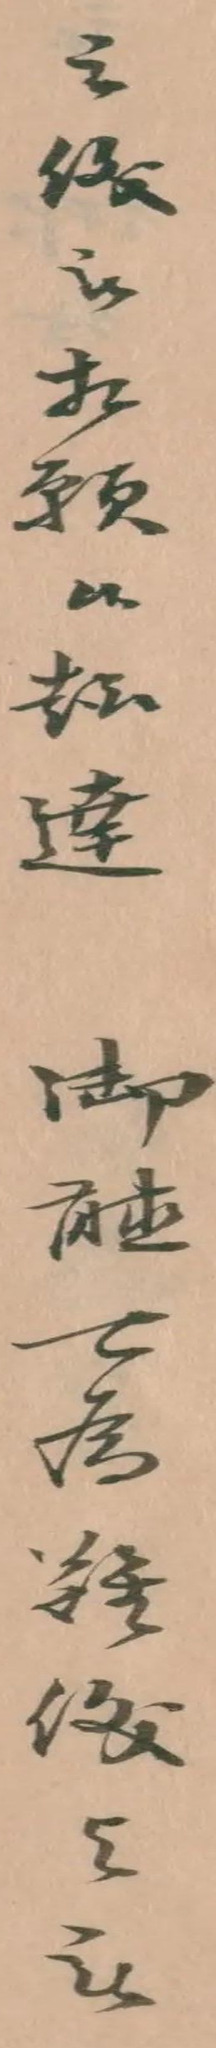之義被相願候趣達御聴可為難儀と被
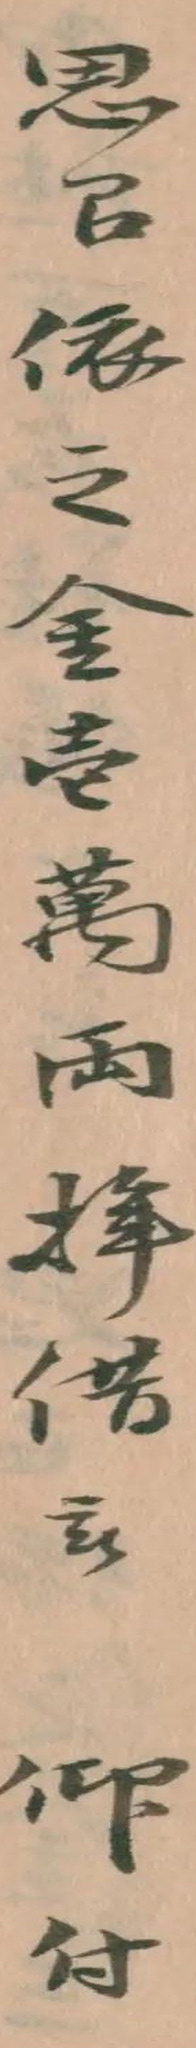思召依之金壱万両拝借被仰付
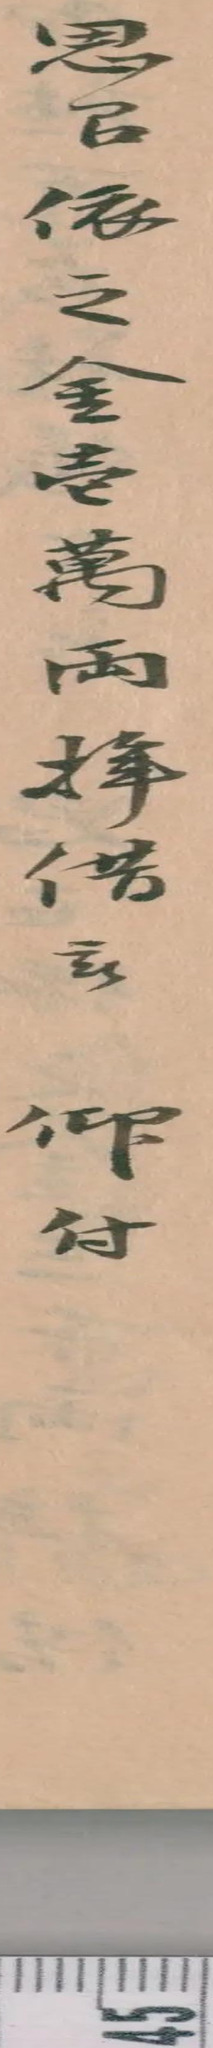思召依之金壱万両拝借被仰付
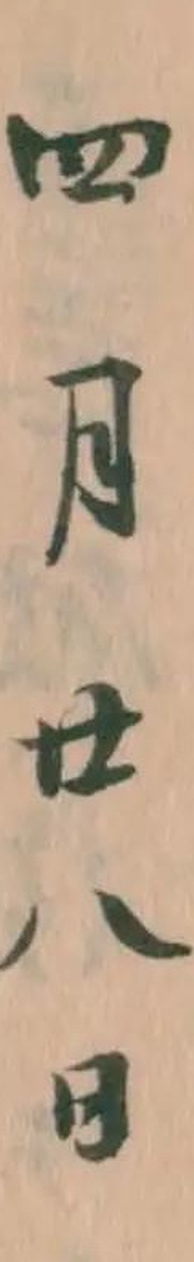四月廿八日
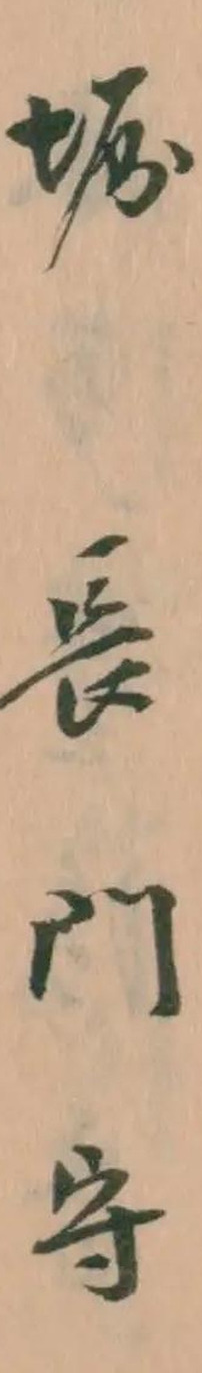堀長門守
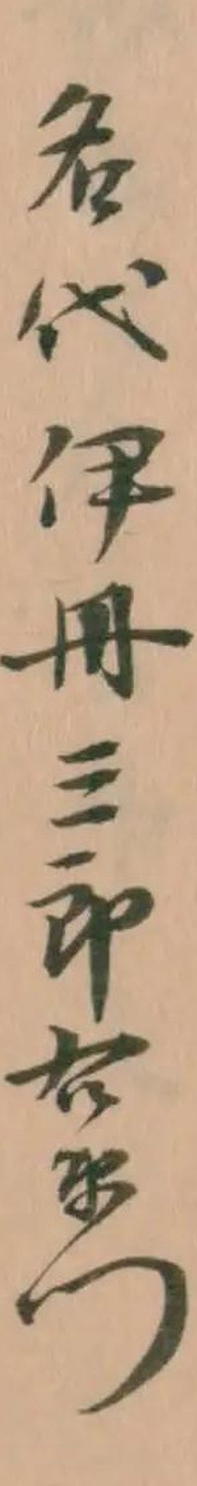名代伊丹三郎右衛門
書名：地災撮要. 巻3(地震之部)-巻4(噴火之部)
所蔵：国立国会図書館 National Diet Library, JAPAN
